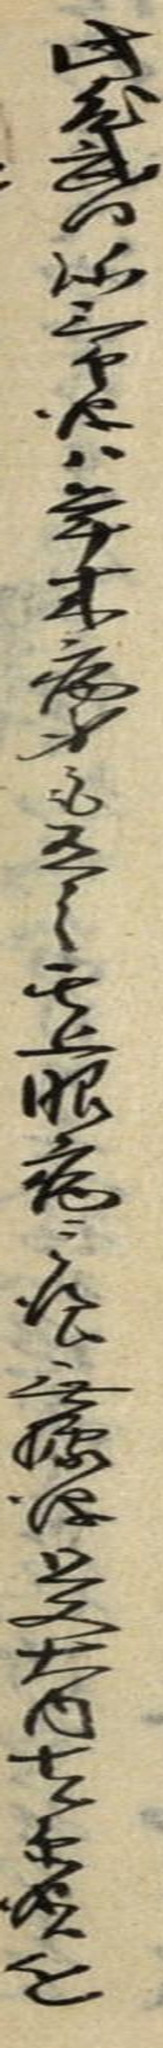一此度武田弥三郎儀は年来病身にも有之其上眼病に候得は無拠儀且又大内七郎兵衛儀は近
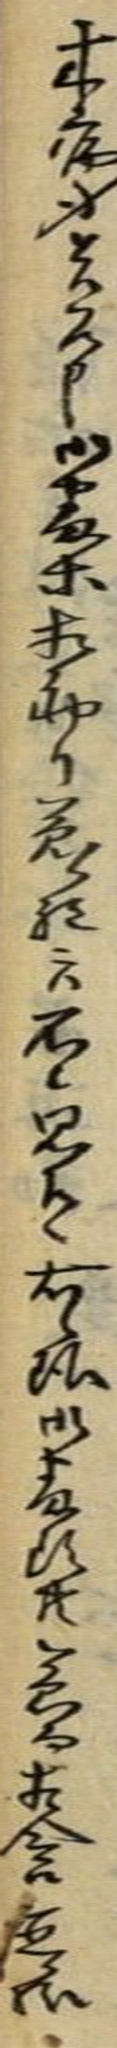来病身とは乍申御番等相勤り兼候程には不被思召候右之趣御番頭共兼而相含置候様
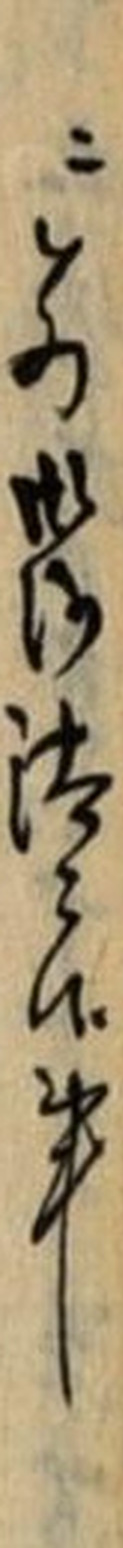にとの御沙汰に候事
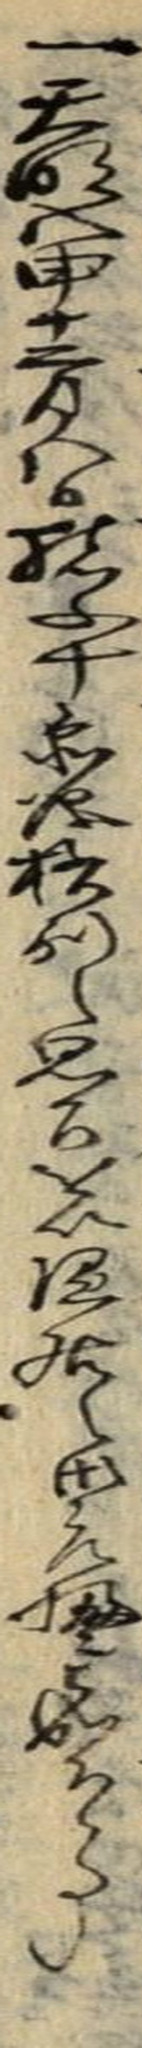一天明八申十二月八日猪子十兵衛儀格別之思召を以隠居之御取扱に被成下候事
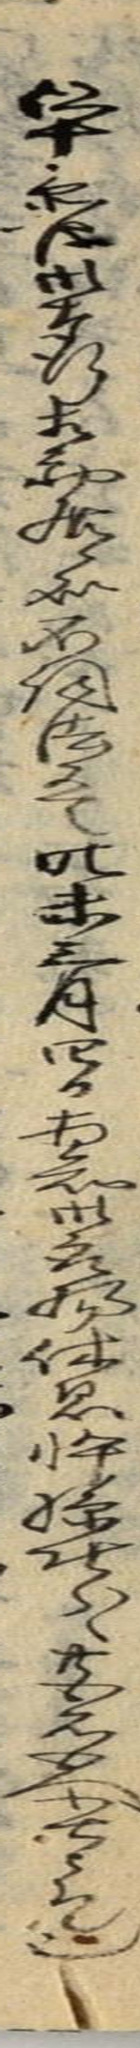但十兵衛儀御奉行相勤居候処不調法有之昨未三月四日拝知御取揚休息忰孫次郎へ廿五石五人ふち被下之候也
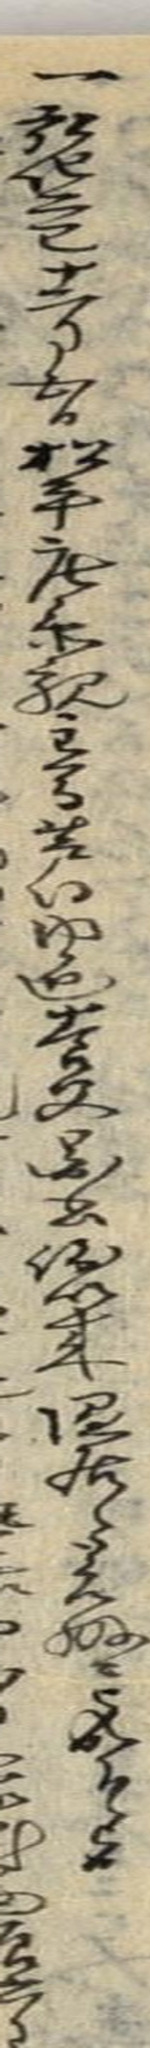一弘化二巳十二月五日松平庄兵衛親主馬芦田内匠養父図書儀以来隠居之御取扱に被成下候旨
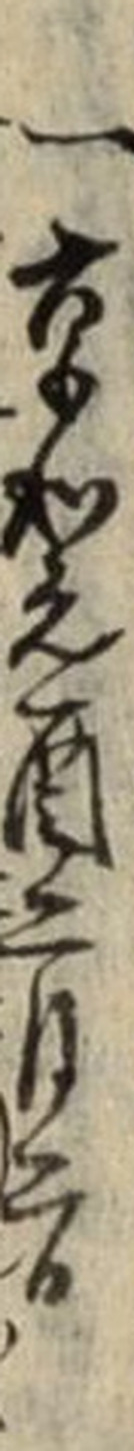一享和元酉二月二日
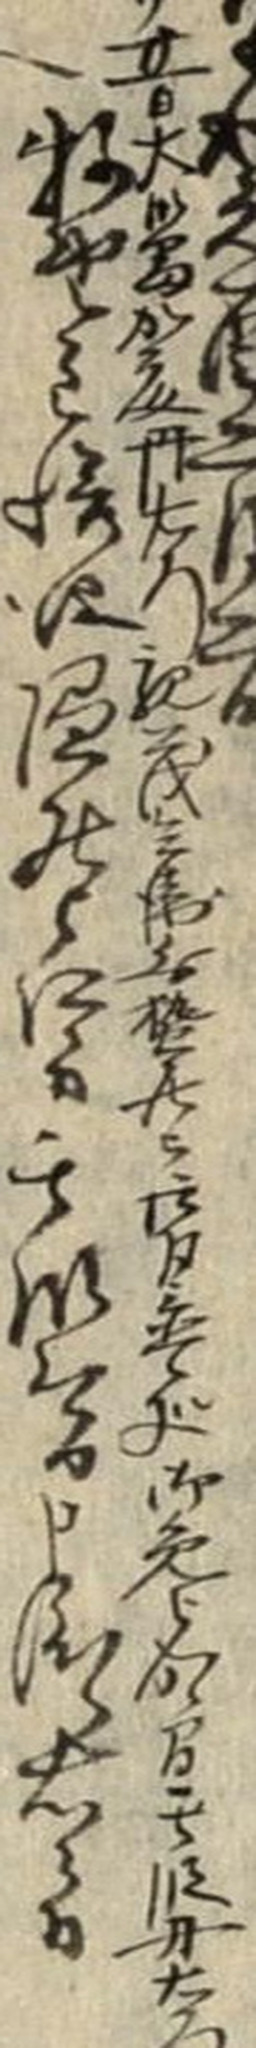牧野主膳儀隠居被仰付其段今日申渡候右に付
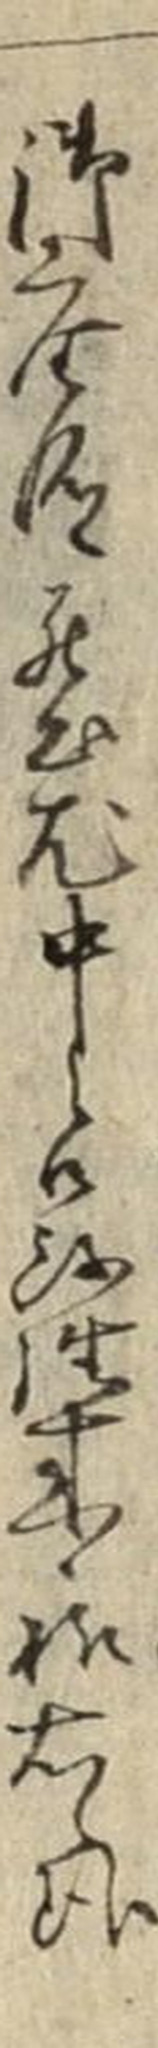御座所へ罷出尤中之口致往来候様右之趣
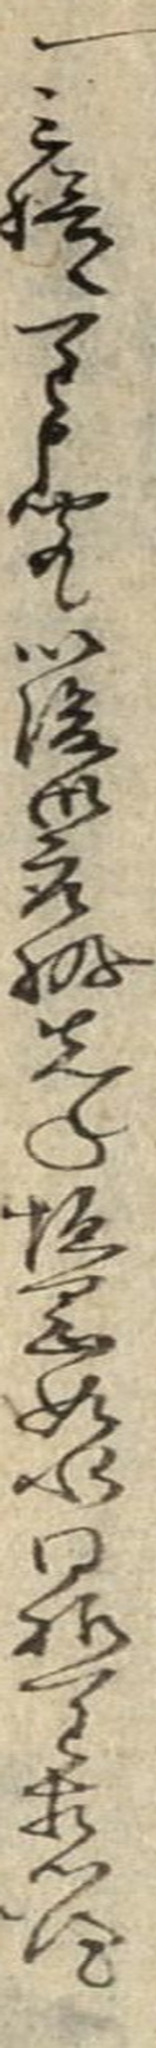主膳へ可被申聞候以後御取扱先年恒岡如水同様可被相心得候
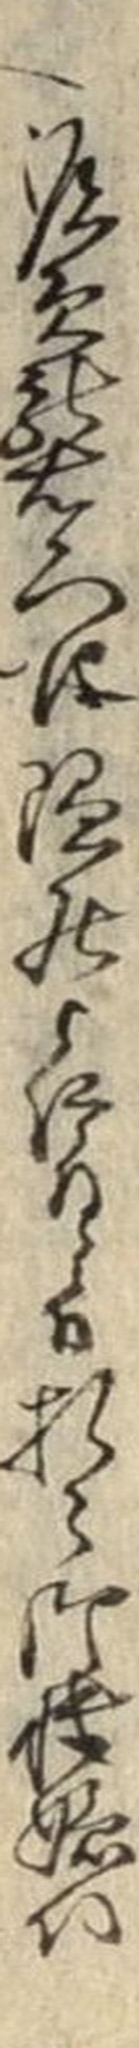渥美新右衛門儀隠居被仰付候に付折々御機嫌伺
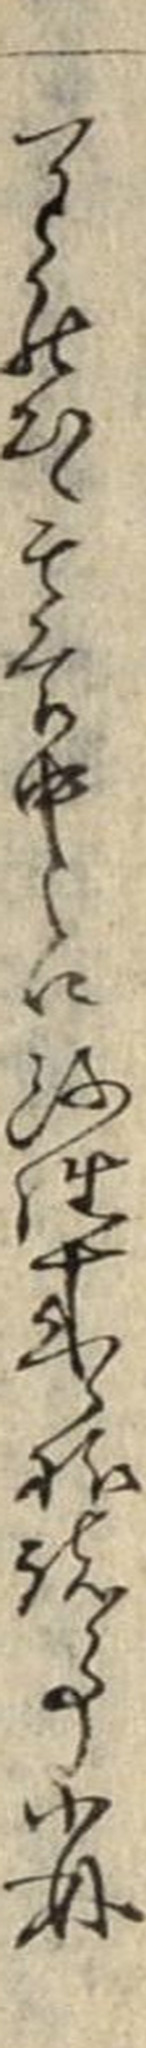可被罷出候其節中之口致往来候様諸事小林
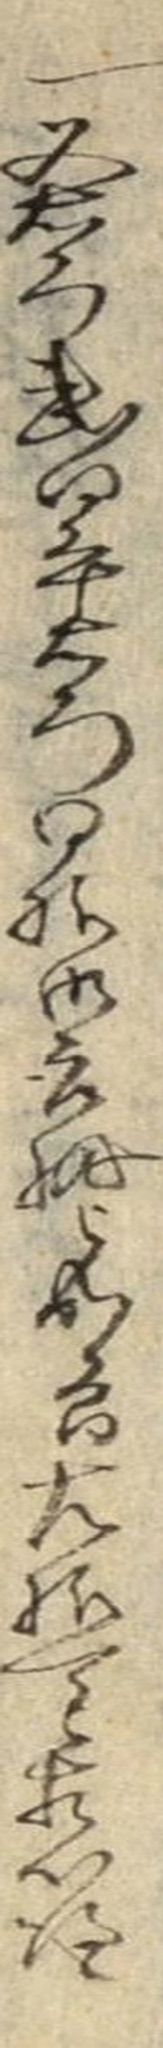五右衛門武田平右衛門同様御取扱被成候間左様可被相心得候
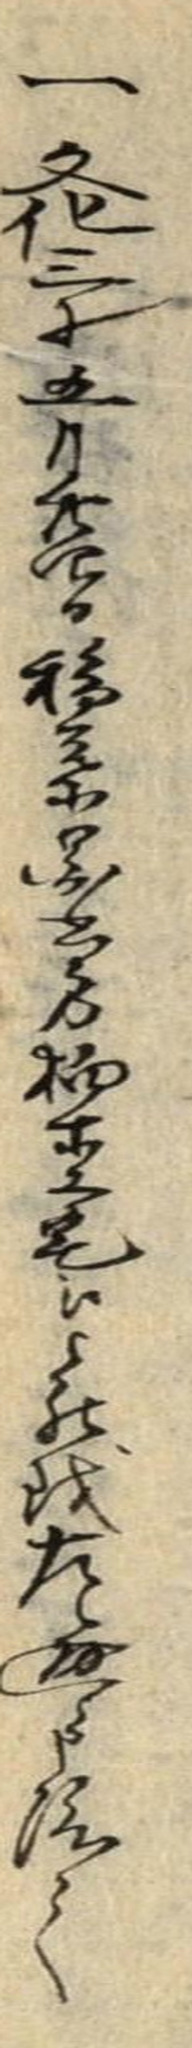一文化三寅五月廿四日稻葉図書方狛木工宅江被罷越左之通被申渡之
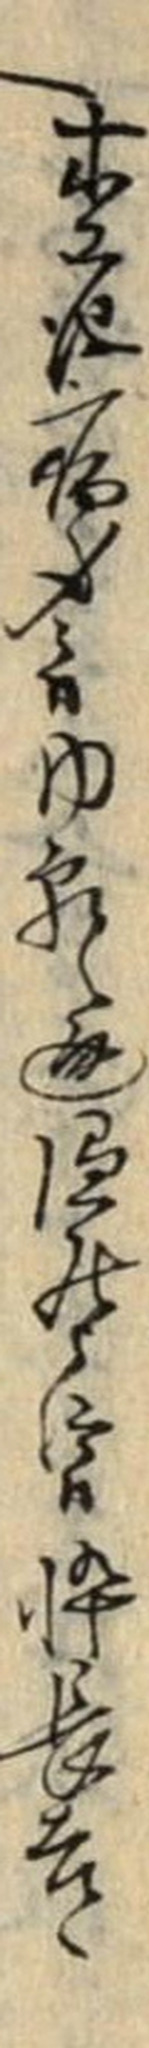木工儀病身に付内願之通隠居被仰付忰長吉へ
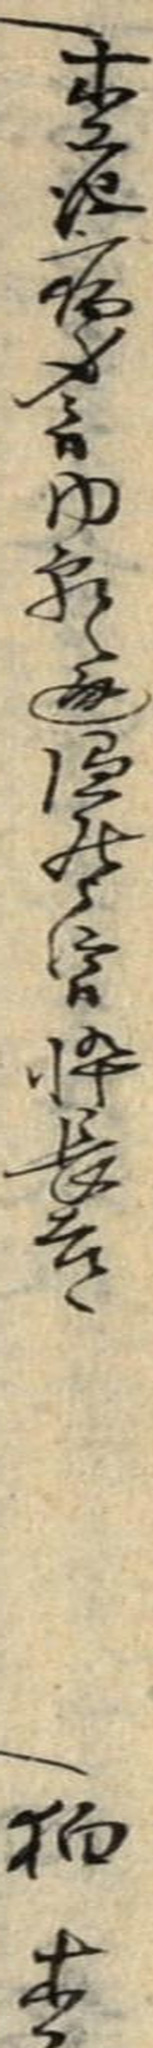木工儀病身に付内願之通隠居被仰付忰長吉へ
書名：御用并被仰出之部
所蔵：福井県文書館 Fukui Prefectural Archives
